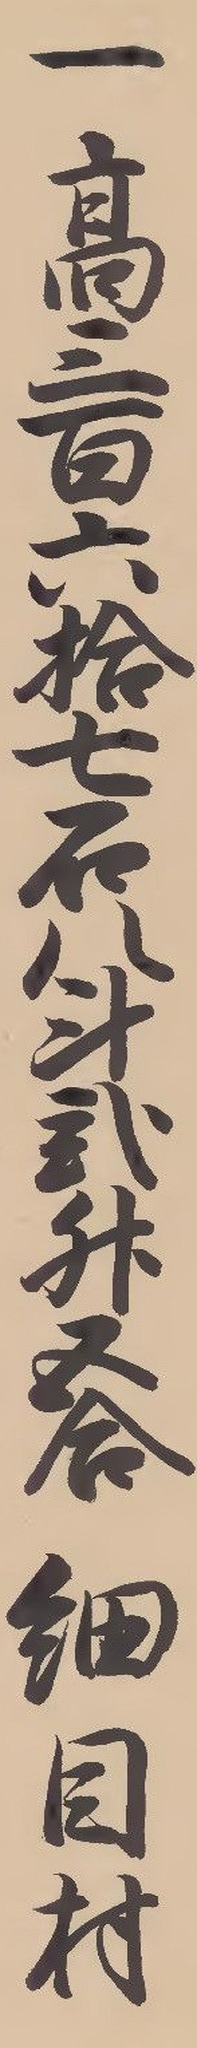一高三百六拾七石八斗弐升五合細目村
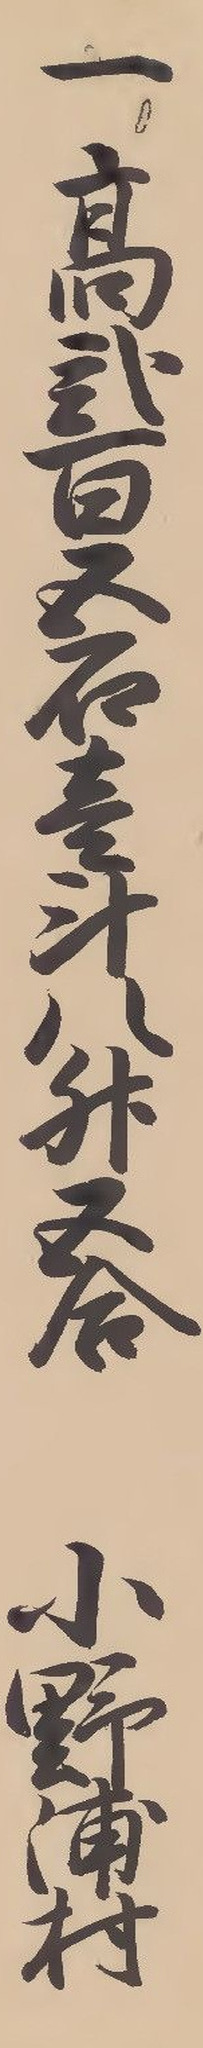一高弐百五石壱斗八升五合小野浦村
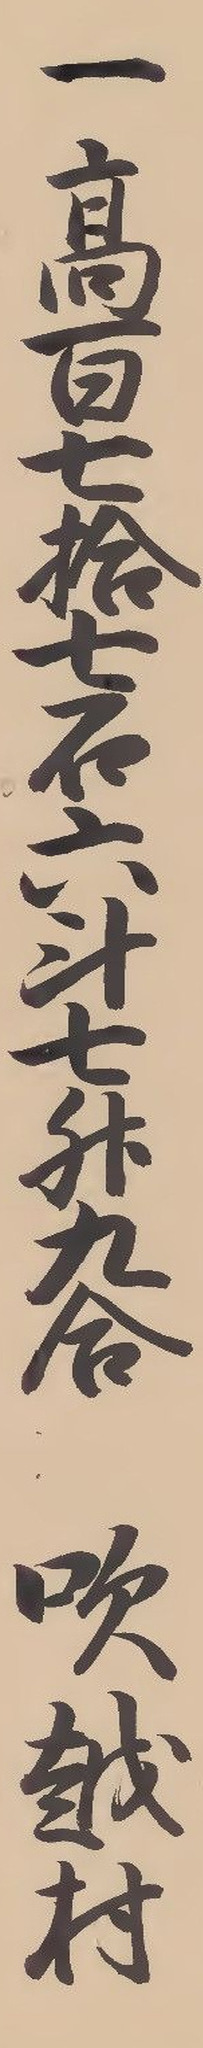一高百七拾七石六斗七升九合吹越村
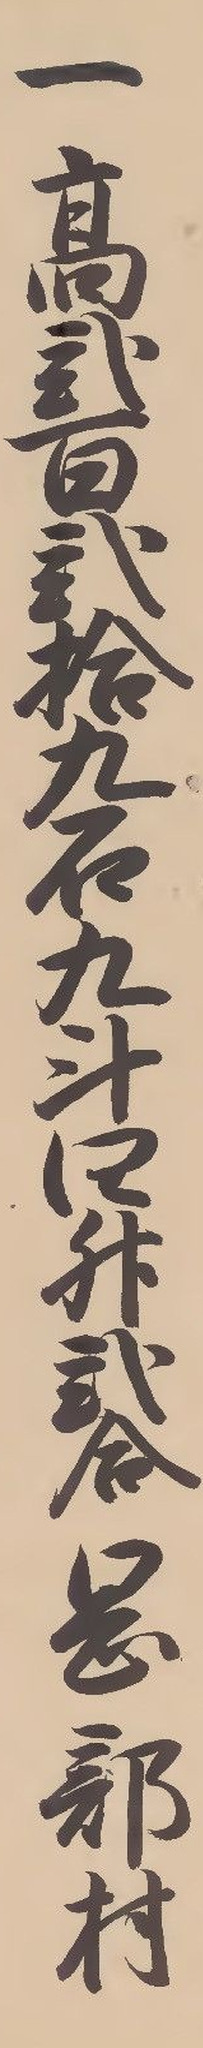一高弐百弐拾九石九斗四升弐合岡部村
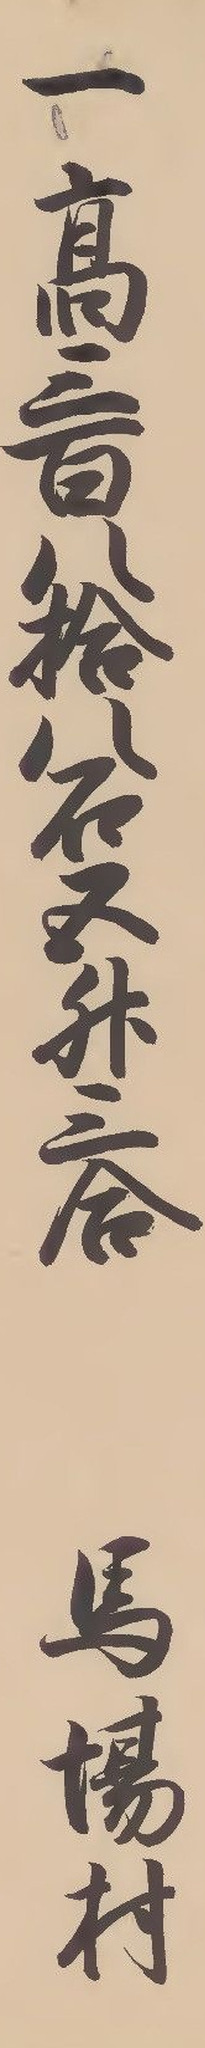一高三百八拾八石五升三合馬場村
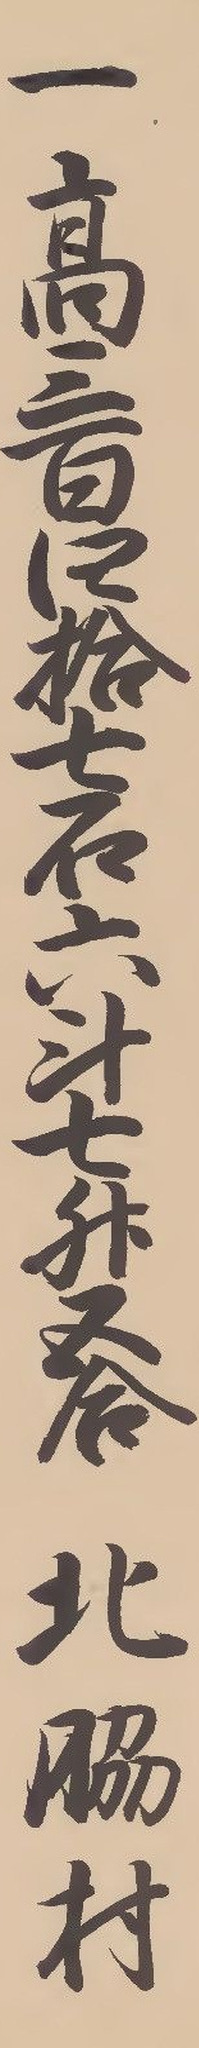一高三百四拾七石六斗七升五合北脇村
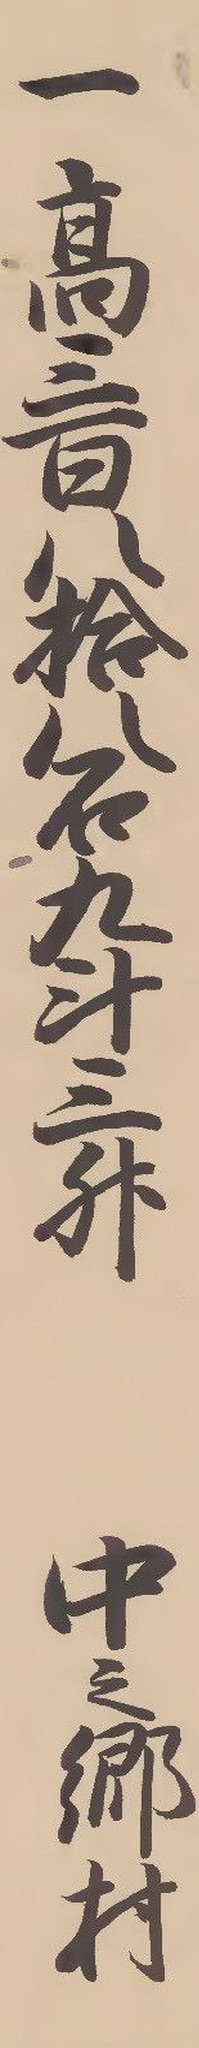一高三百八拾八石九斗三升中之郷村

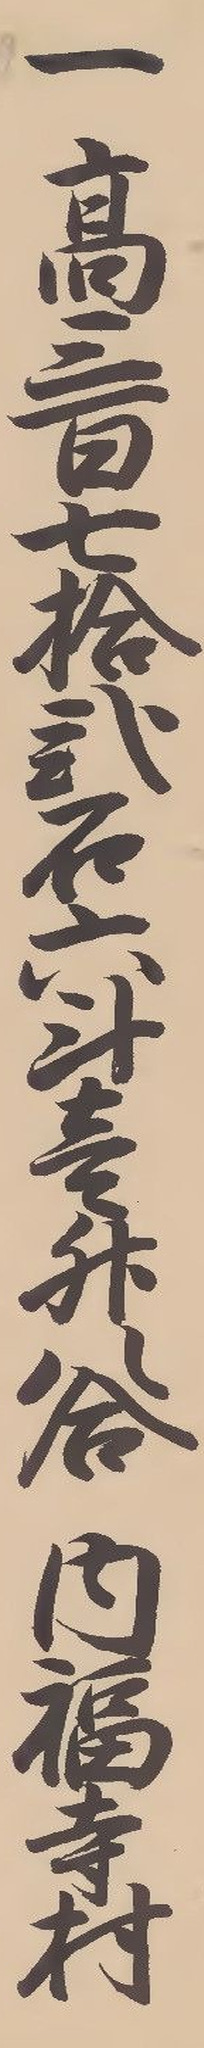一高三百七拾弐石六斗壱升八合内福寺村
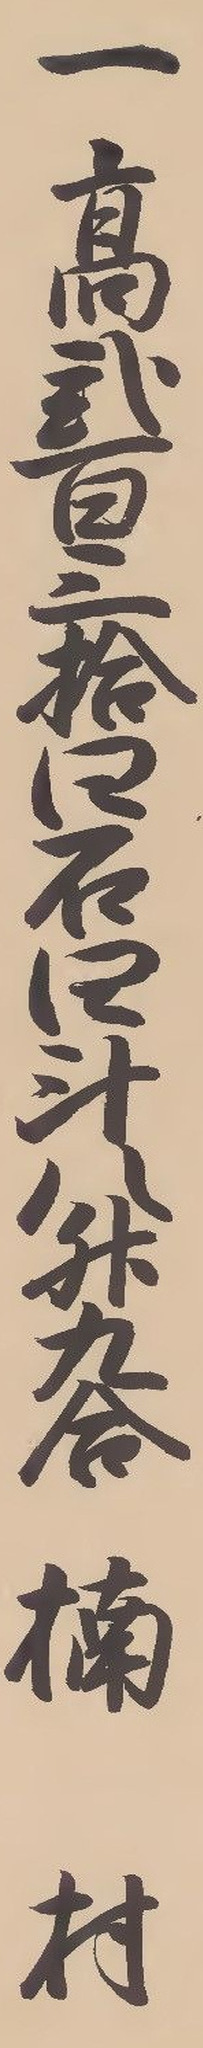一高弐百三拾四石四斗八升九合楠村
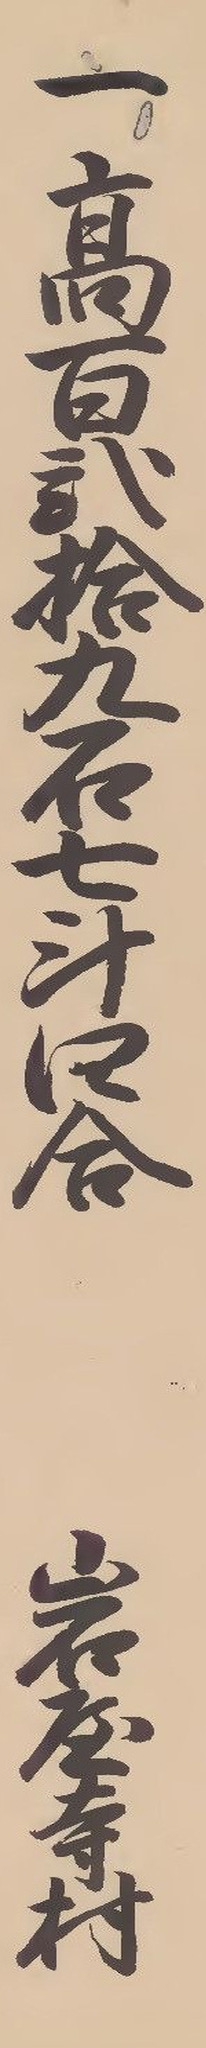一高百弐拾九石七斗四合岩屋寺村
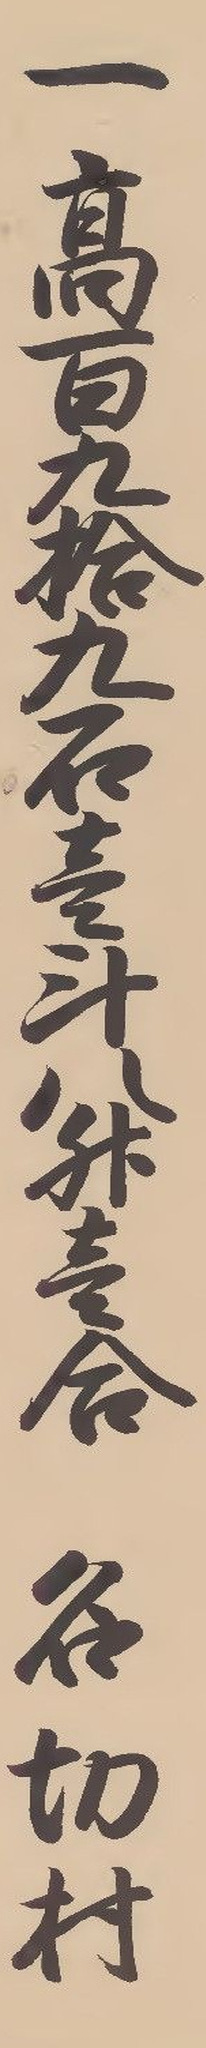一高百九拾九石壱斗八升壱合名切村
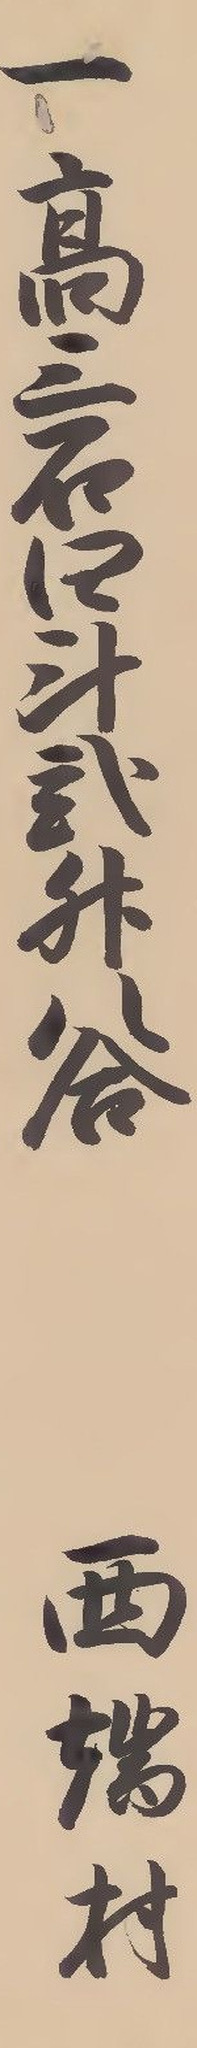一高三石四斗弐升八合西端村
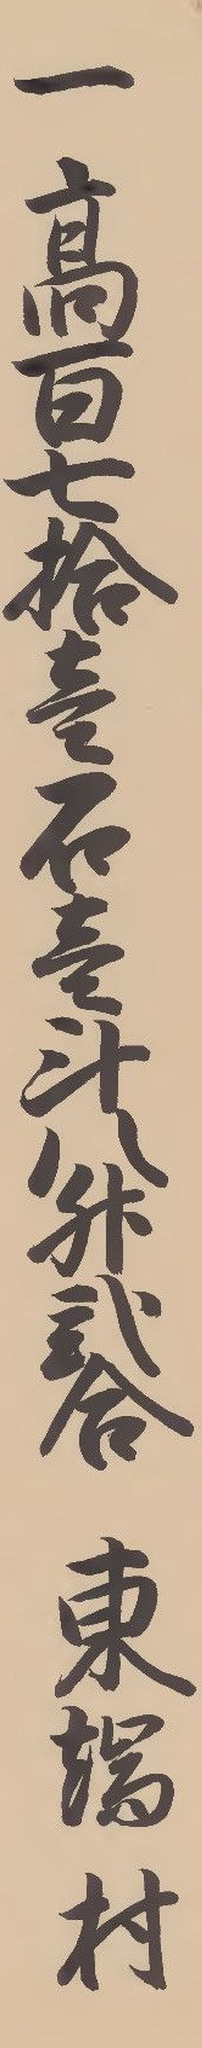一高百七拾壱石壱斗八升弐合東端村
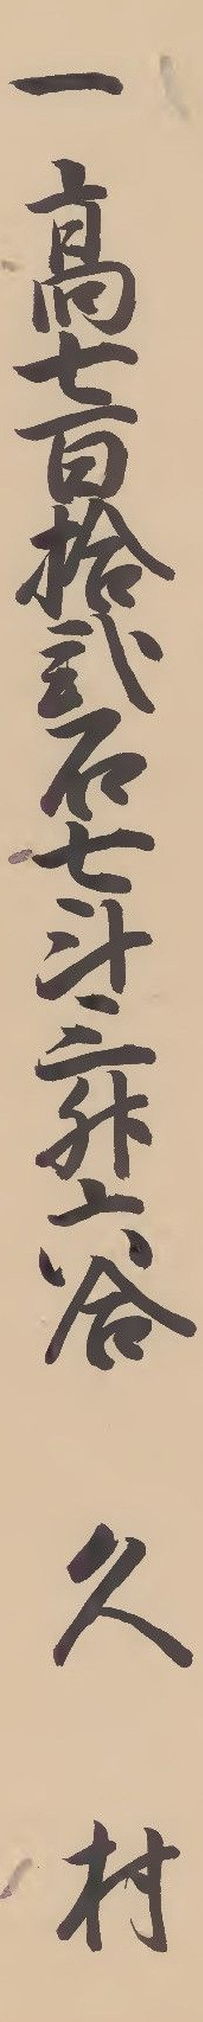一高七百拾弐石七斗三升六合久村

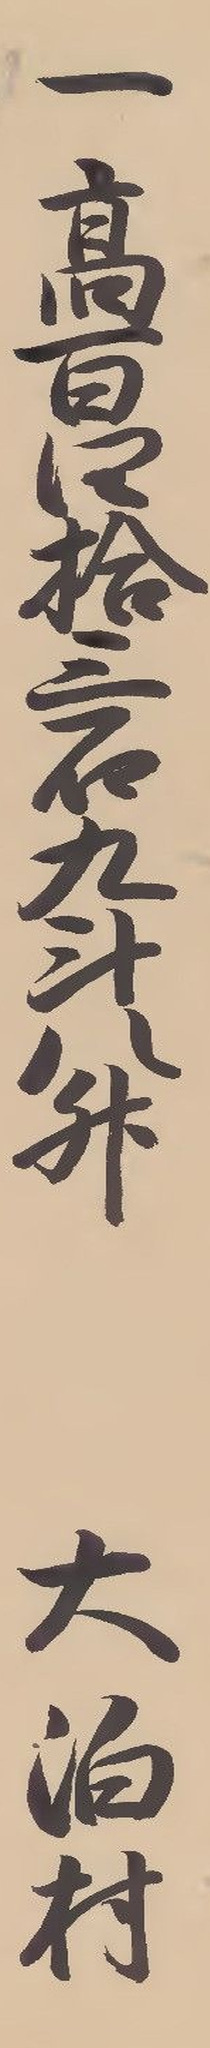一高百四拾三石九斗八升大泊村
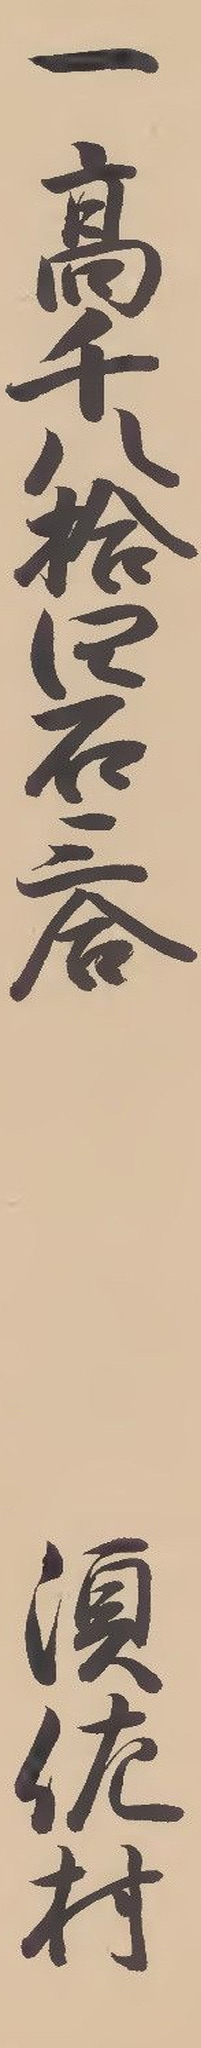一高千八拾四石三合須佐村
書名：尾張国郷帳
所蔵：国立公文書館 National Archives of Japan
